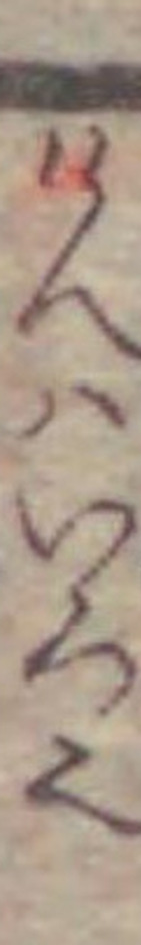けんはいろ也
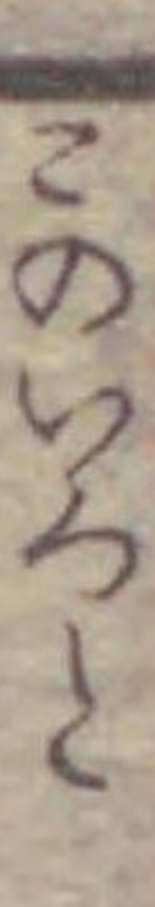このいろと
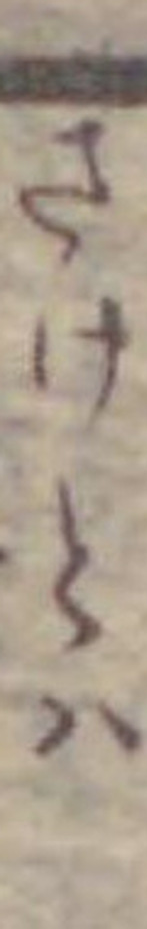さけとは
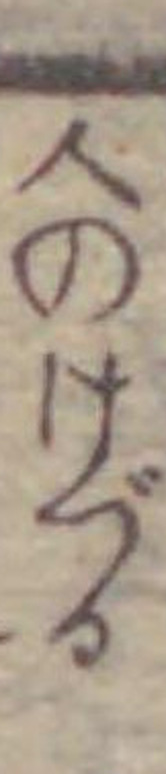人のけづる
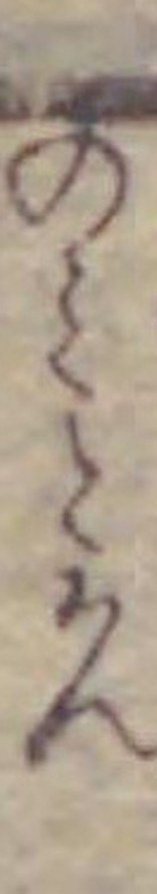のみとかん
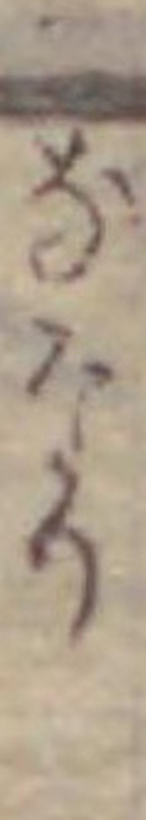ななり
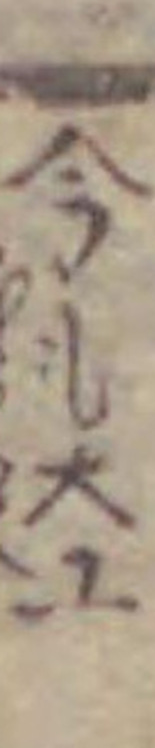今も大工
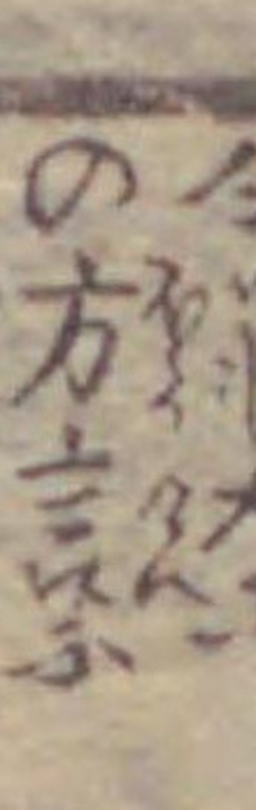の方言に
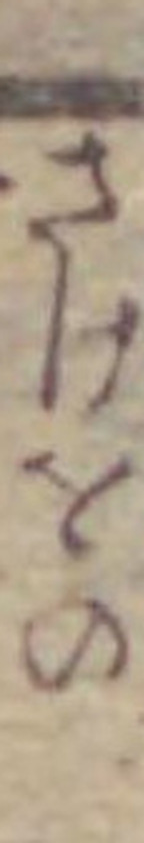さけをの
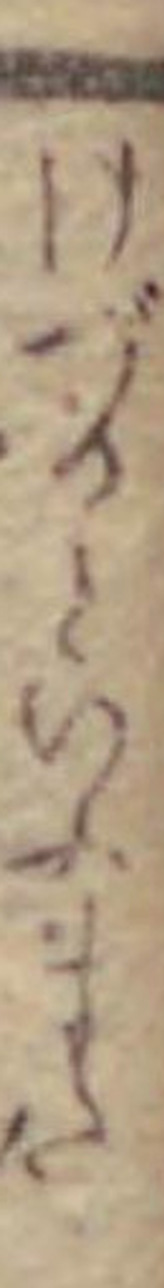けづるといふまた
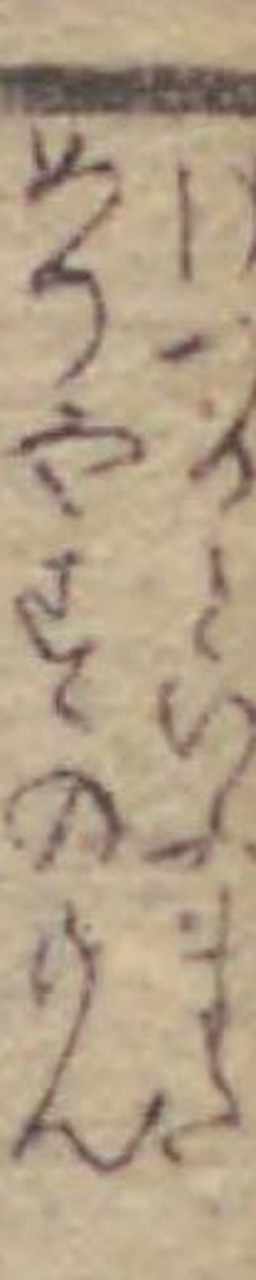めりやすのけん
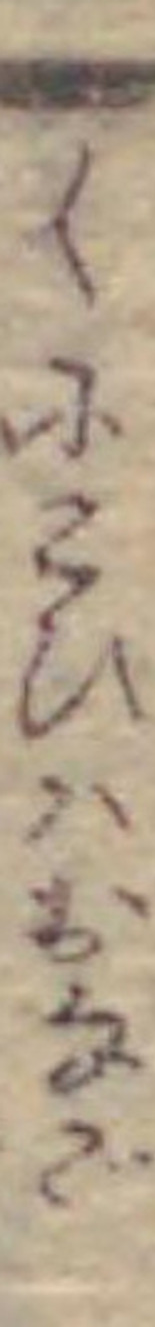〳〵にこひはおなご
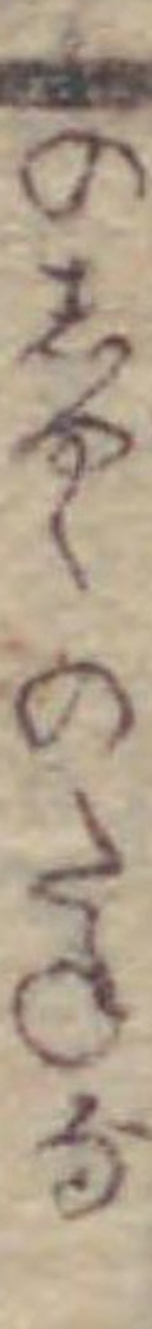のしやくのたねな
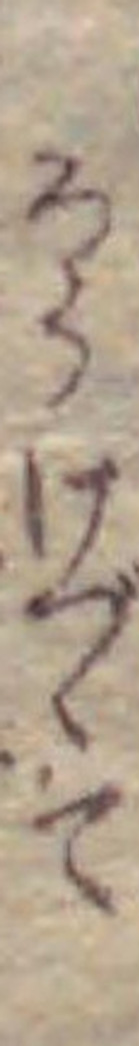ろうけづゝて
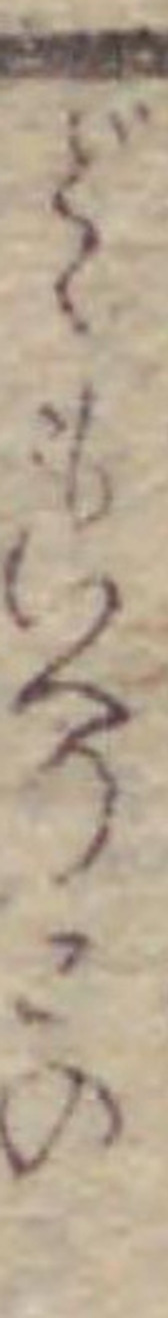どゝもいへりこの
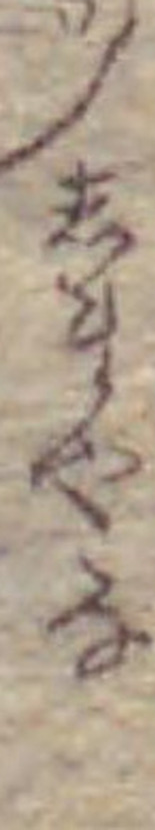しまやな
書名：鼻下長生薬 : 3巻
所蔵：国立国会図書館 National Diet Library, JAPAN
